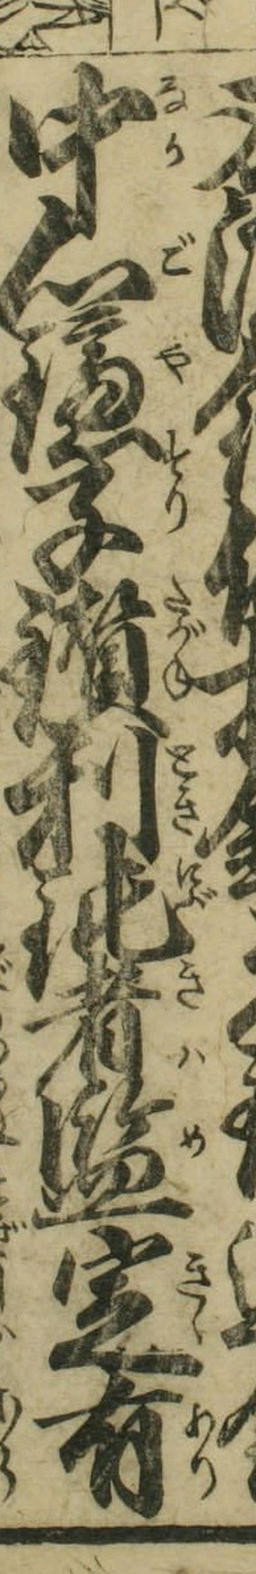中心鑢子鑽利鈍者監定有
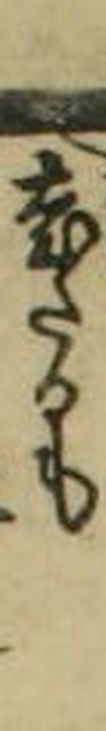老たるも
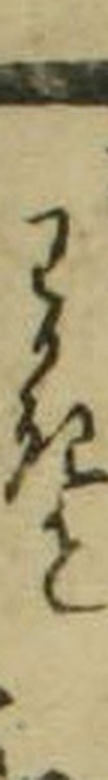わかきも
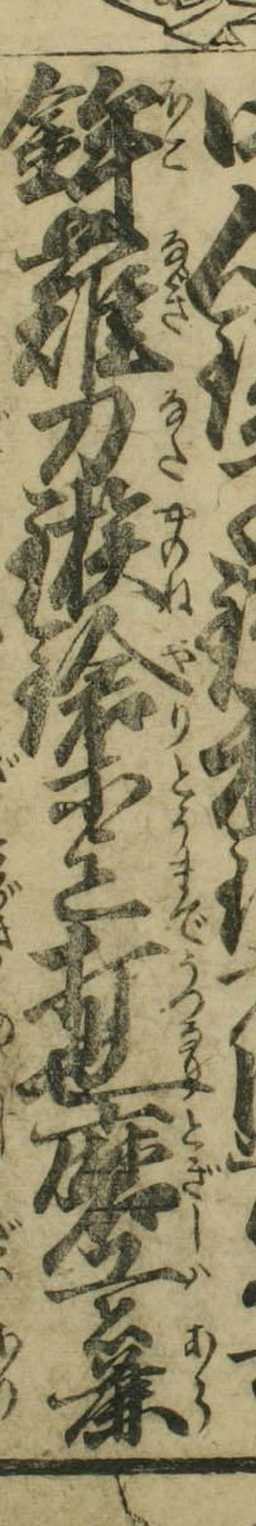鉾薙刀鏃槍等迄打也磨工者麁
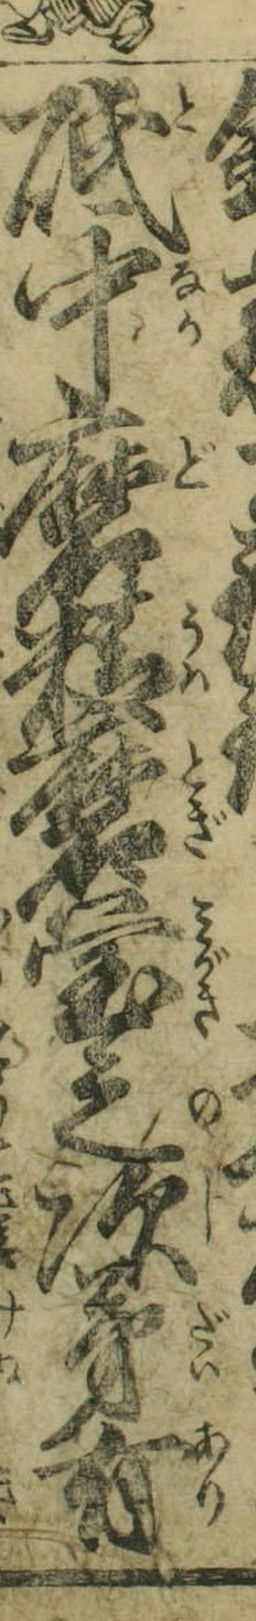砥中磨精磨瑩之次第有
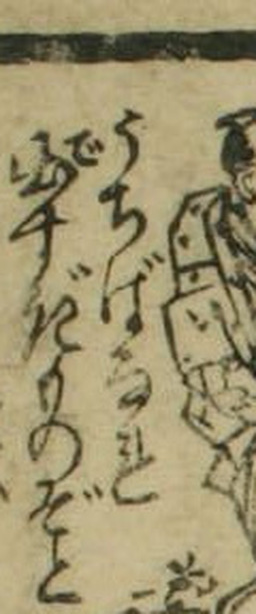うちばなれ
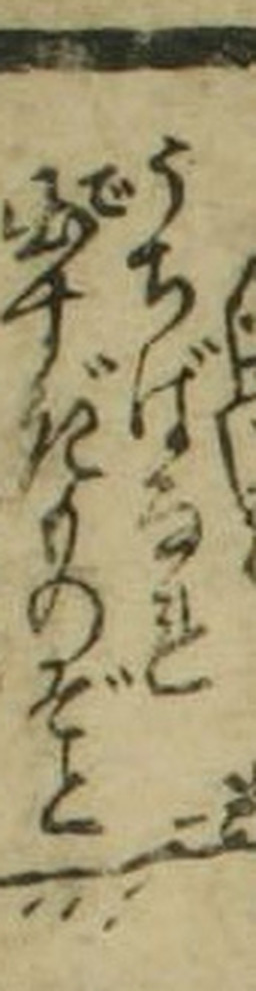出すぎものぞと
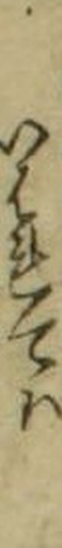いはれては
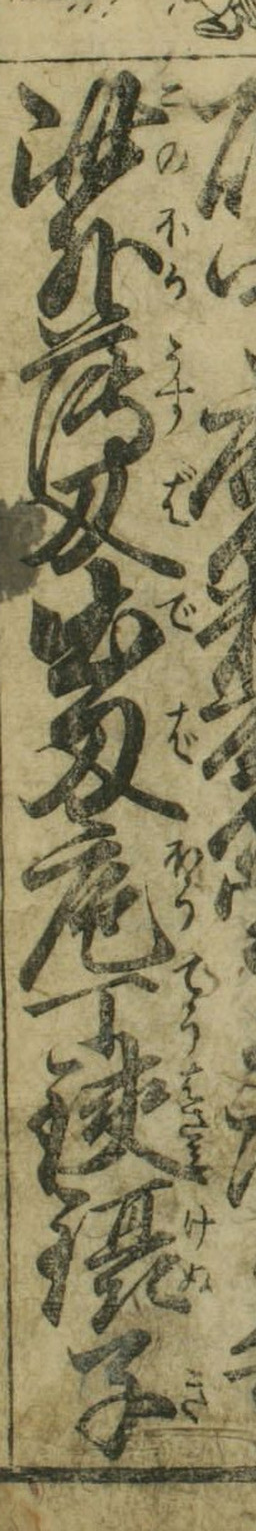此外薄刃出刃包丁鋏鑷子

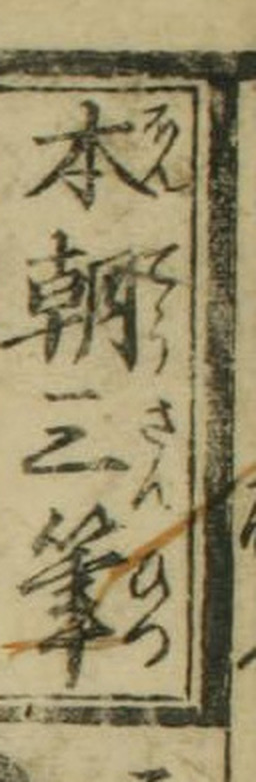本朝三筆
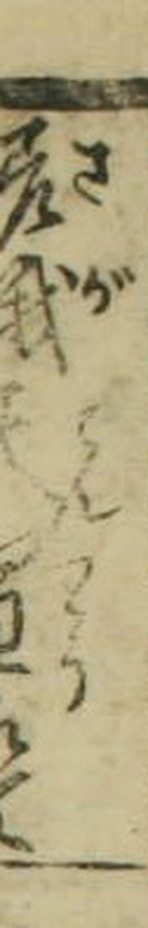嵯峨天皇は
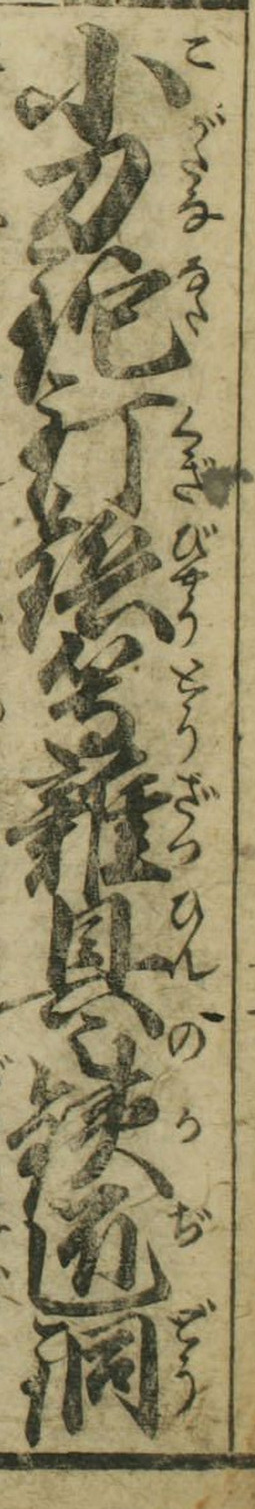小刀鉈釘鋲等雑具之鉄匠銅
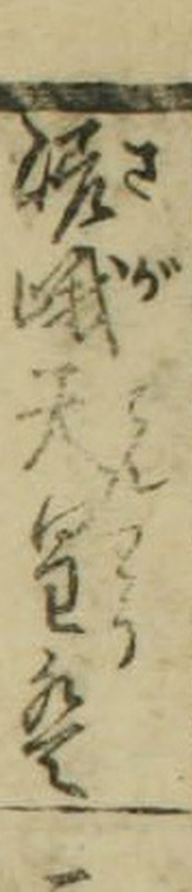嵯峨天皇は
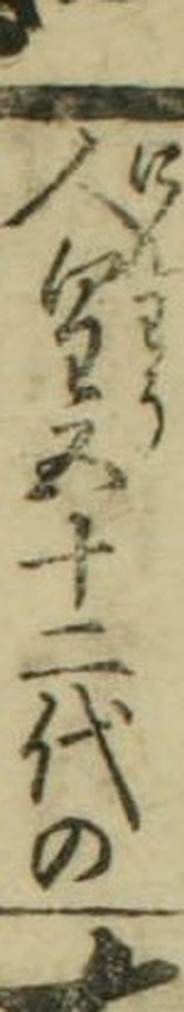人皇五十二代の
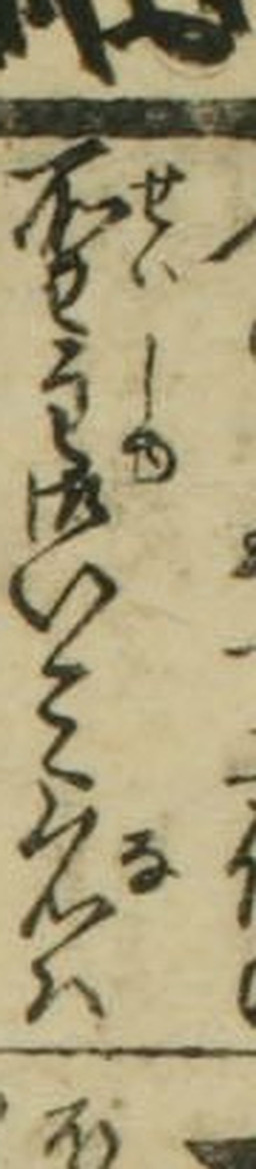聖主御いみ名は
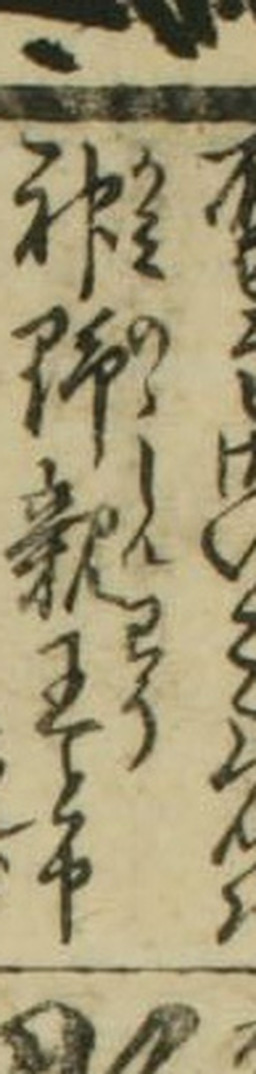神野親王と申
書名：増補職人往来
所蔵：東京学芸大学教育コンテンツアーカイブ
